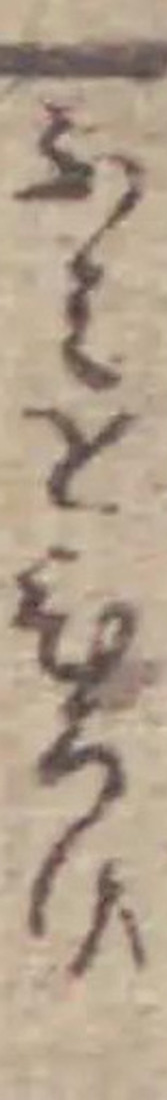ふみをひろひ
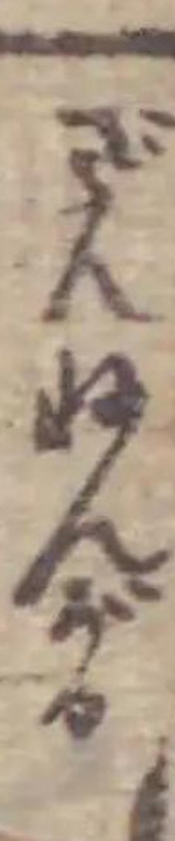ざんねんがる
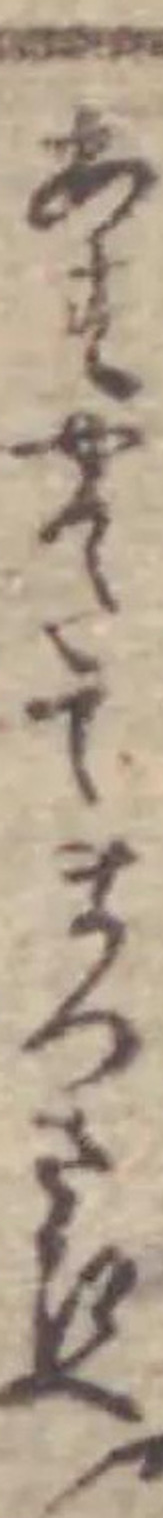あすやかたてまつさきへ
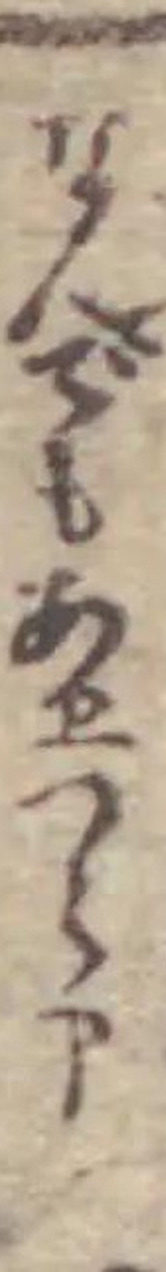なんでもあヱつらァ
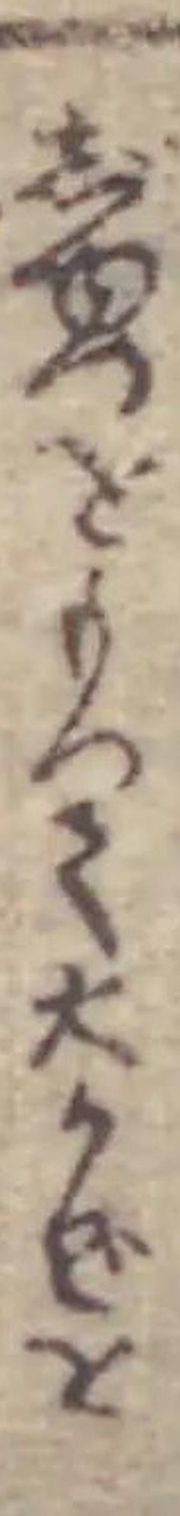じゆつをもつて大かぜを
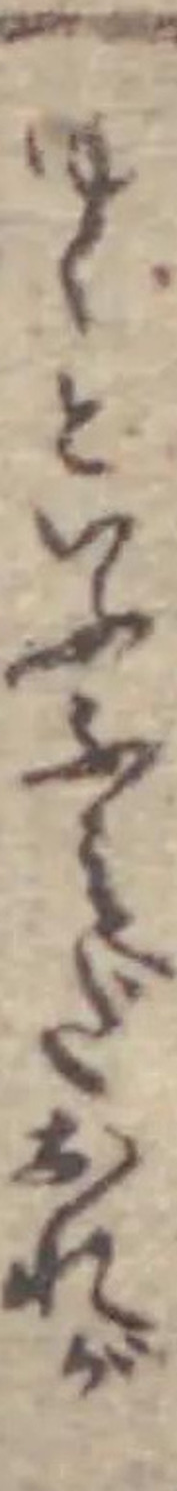ゆくといふふみだおれが
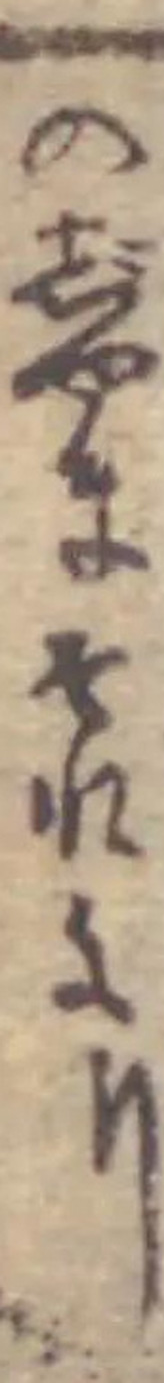のじやまそれに行
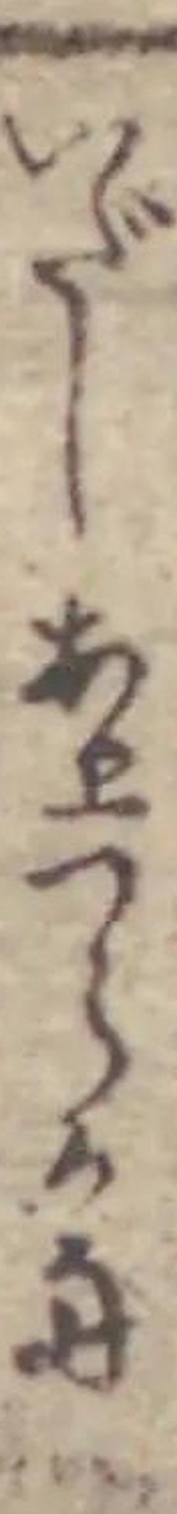いだしあヱつらか舟
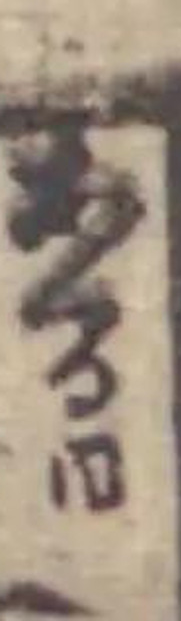あくる日
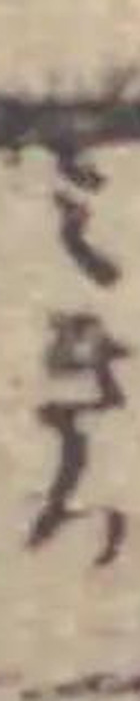みきち
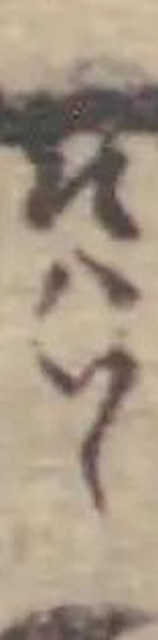次はいゝ
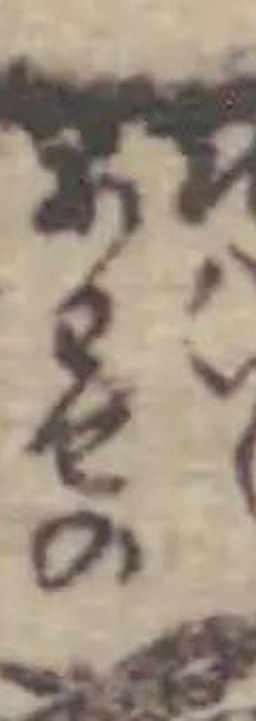あわせの
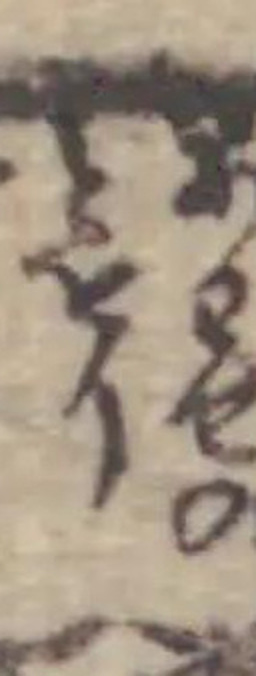とをり
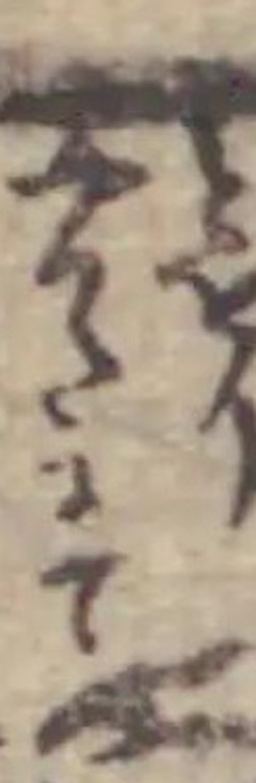やかたにて
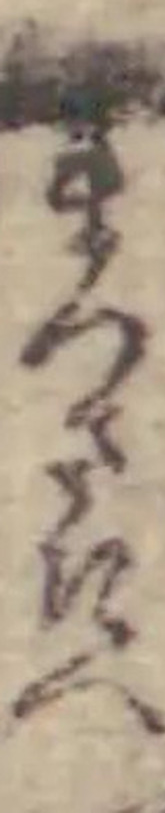まつさきに
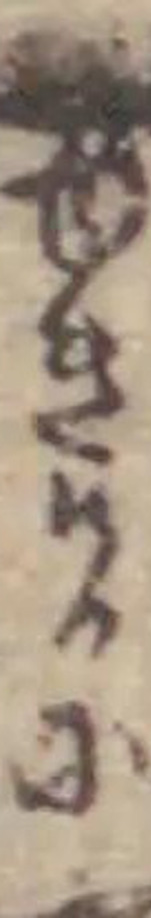ゆきけるに
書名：通人為真似 2巻
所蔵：国立国会図書館 National Diet Library, JAPAN
